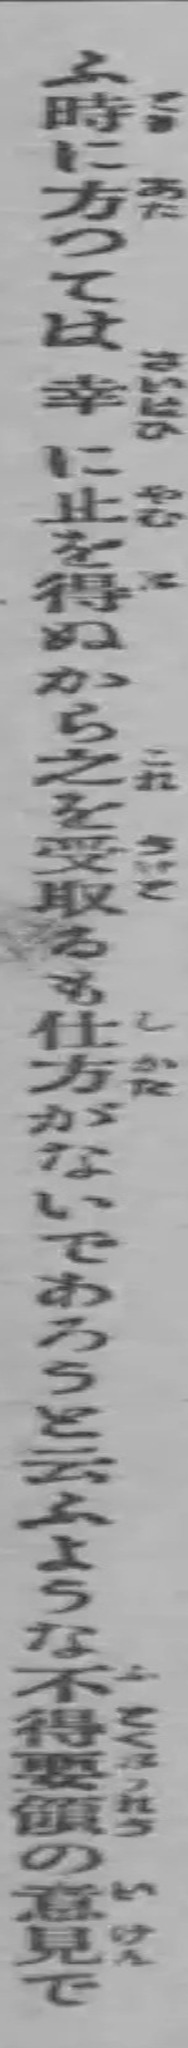ふ時に方つては幸に止を得ぬから之を受取るも仕方がないであろうと云ふような不得要領の意見で

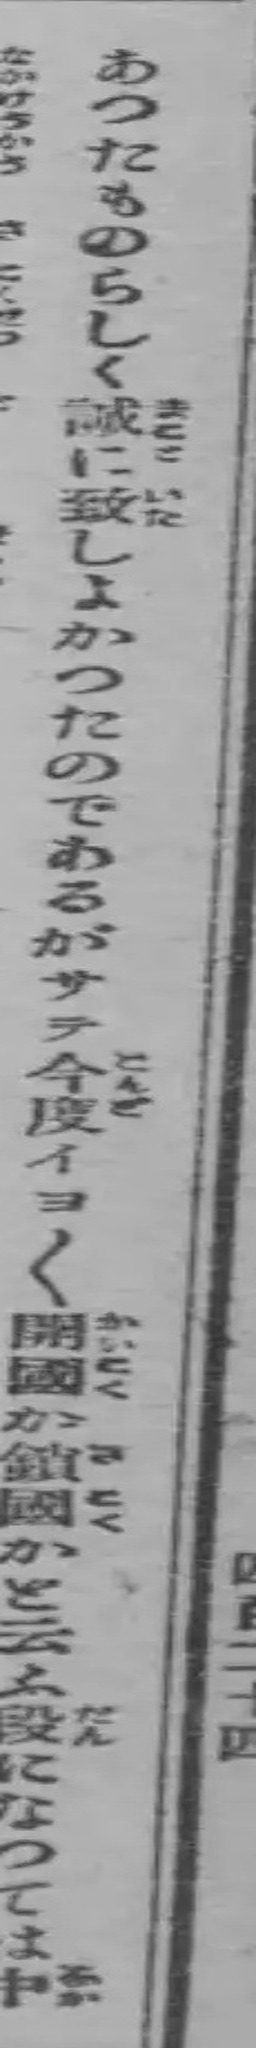あつたものらしく誠に致しよかつたのであるがサテ今度イヨ〳〵開国か鎖国かと云ふ段になつては中
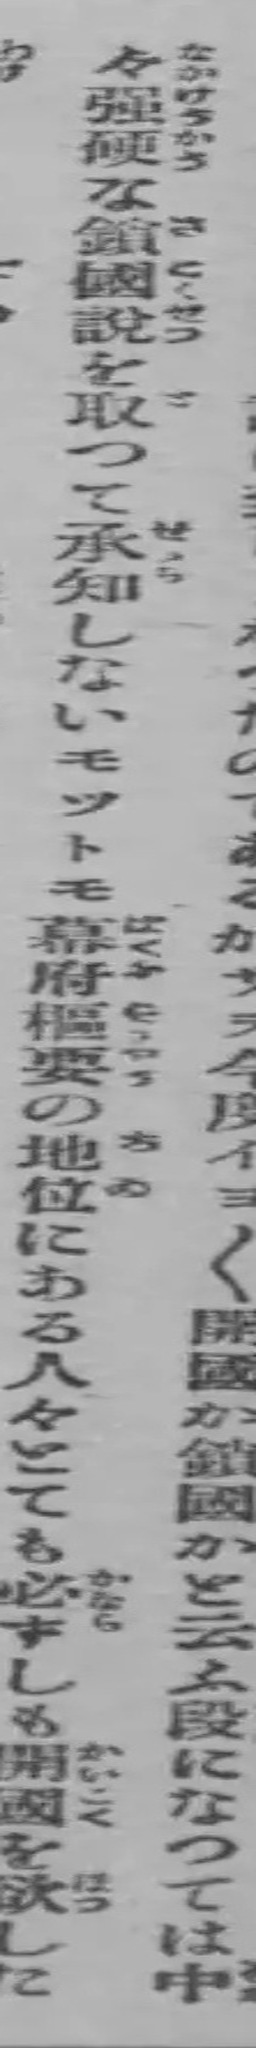中強硬な鎖国説を取つて承知しないモツトモ幕府枢要の地位にある人々とても必ずしも開国を欲した
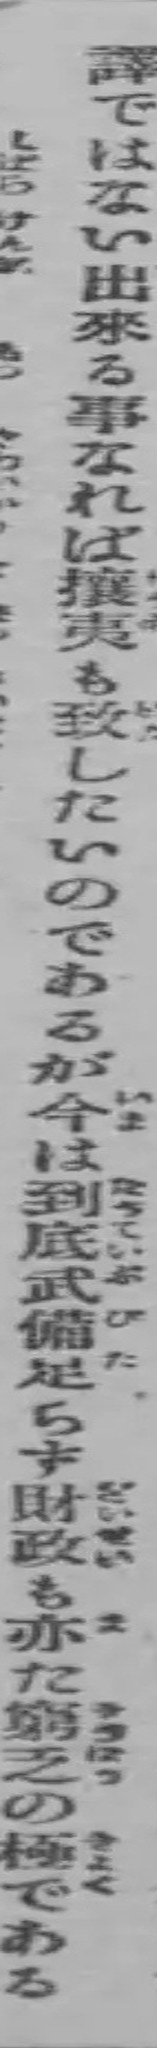訳ではない出来る事なれば攘夷も致したいのであるが今は到底武備足らず財政も亦た窮乏の極である
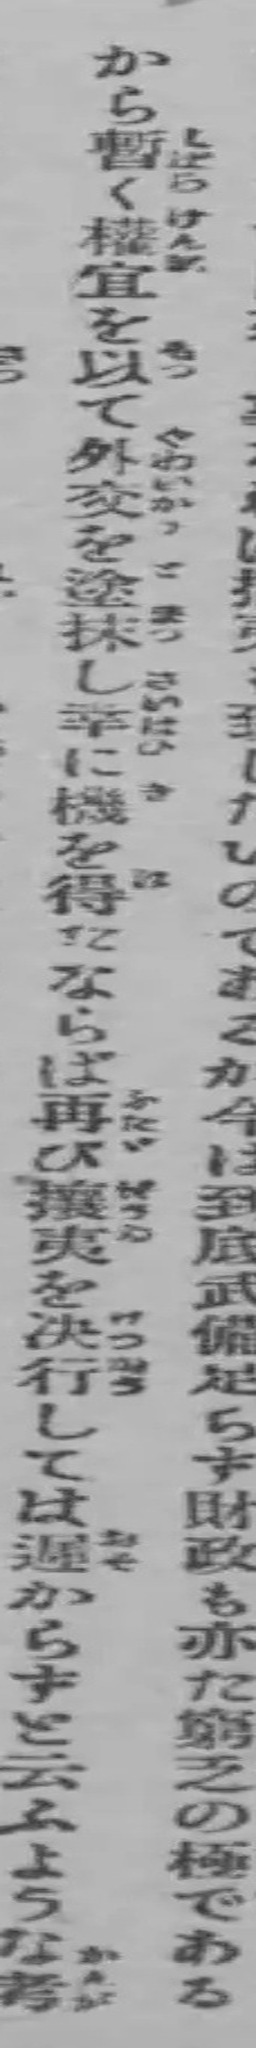から暫く権宜を以て外交を塗抹し幸に機を得たならば再び攘夷を決行しては遅からずと云ふような考
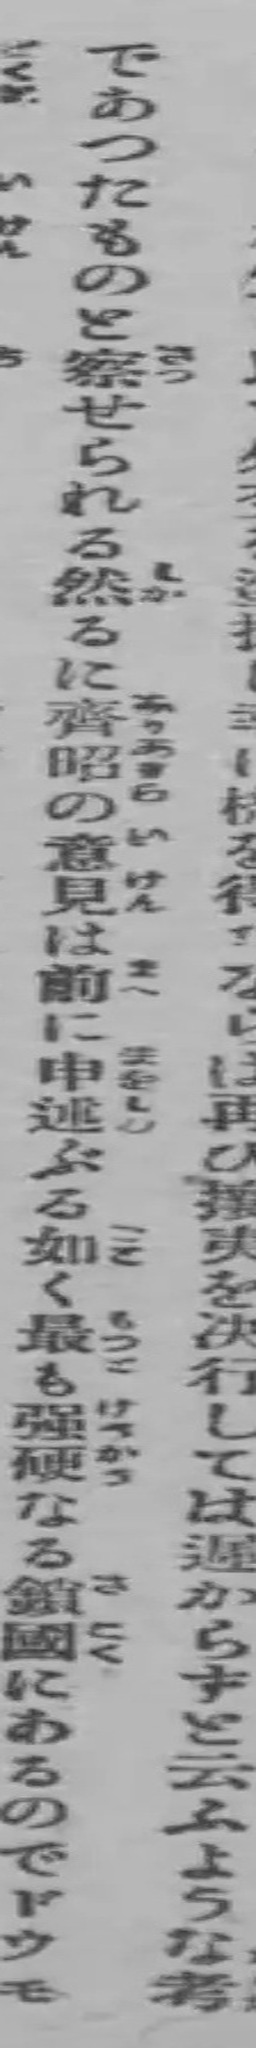であつたものと察せられる然るに斉昭の意見は前に申述ぶる如く最も強硬なる鎖国にあるのでドウモ
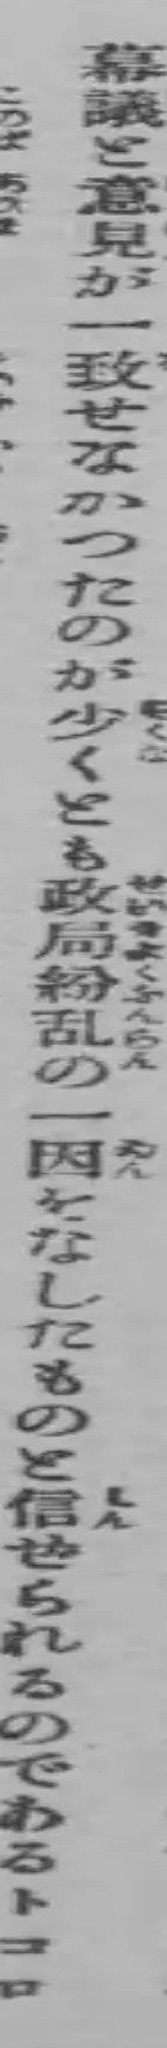幕議と意見が一致せなかつたのが少くとも政局紛乱の一因をなしたものと信ぜられるのであるトコロ
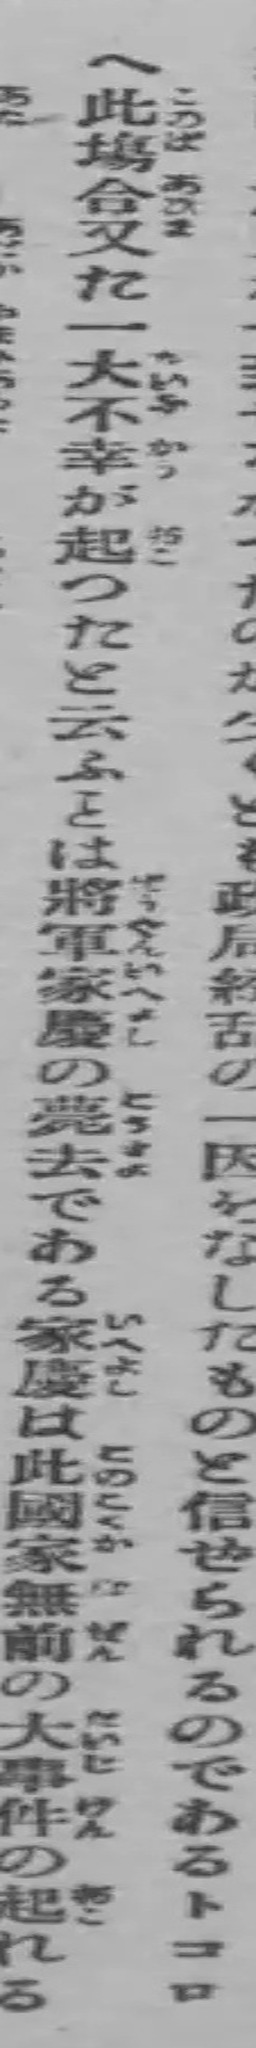へ此場合又た一大不幸が起つたと云ふことは将軍家慶の薨去である家慶は此国家無前の大事件の起れる
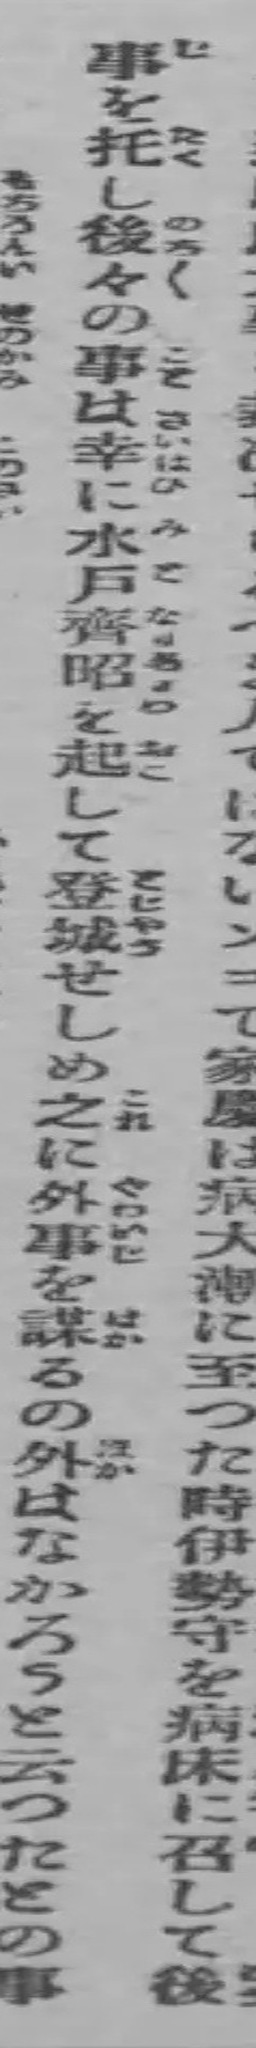事を托し後々の事は幸に水戸斉昭を起して登城せしめ之に外事を謀るの外はなかろうと云つたとの事
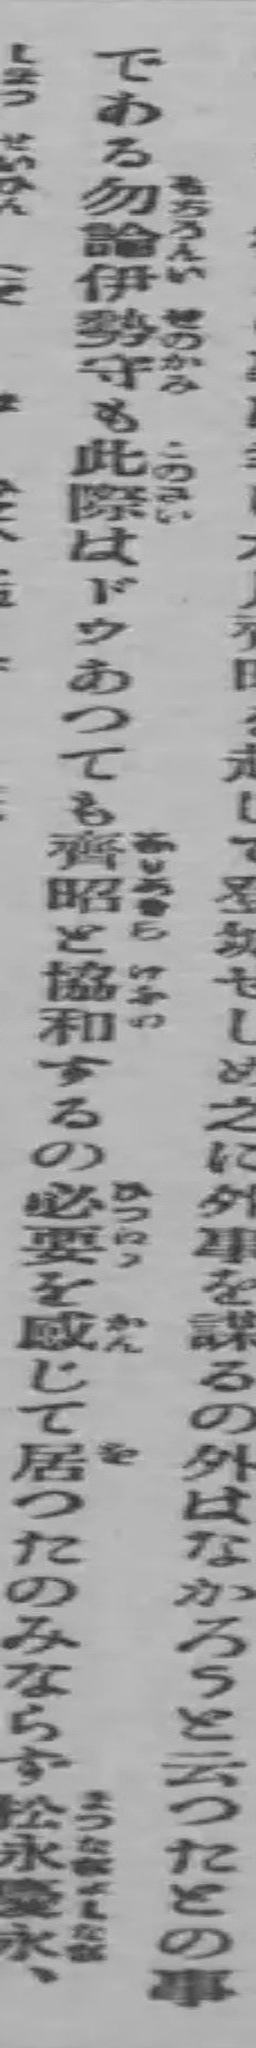である勿論伊勢守も此際はドウあつても斉昭と協和するの必要を感じて居つたのみならず松永慶永、
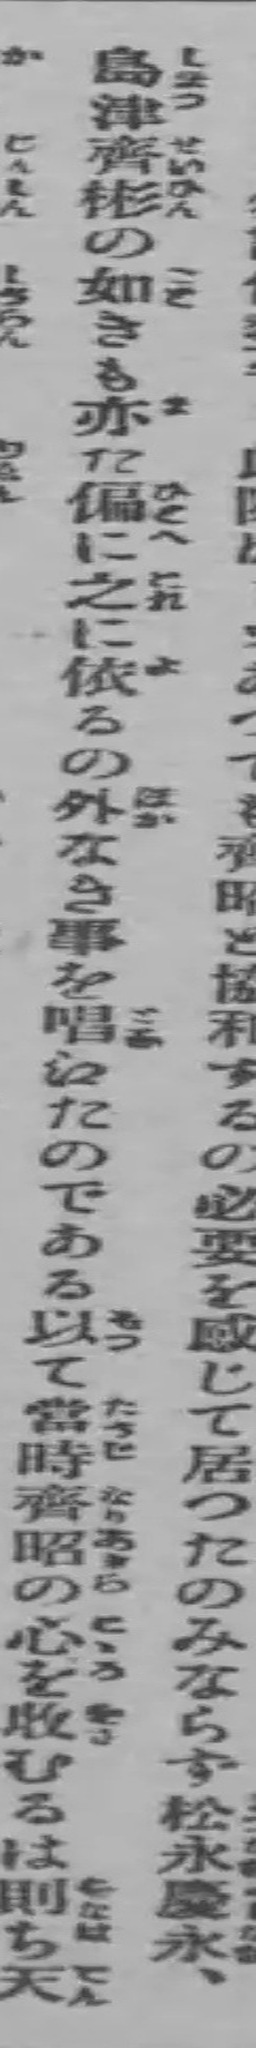島津斉彬の如きも亦た偏に之に依るの外なき事を唱えたのである以て当時斉昭の心を収むるは則ち天
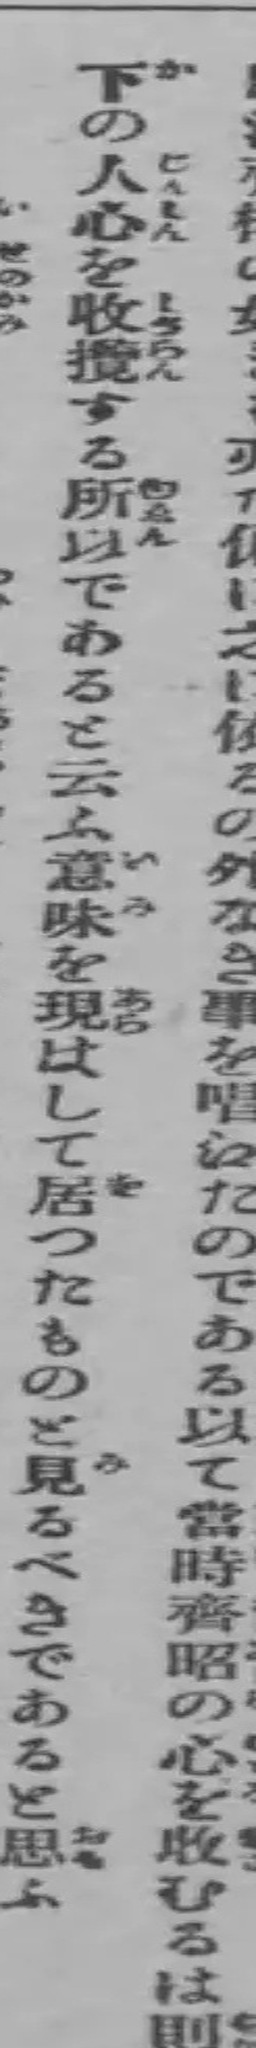下の人心を収攬する所以であると云ふ意味を現はして居つたものと見るべきであると思ふ
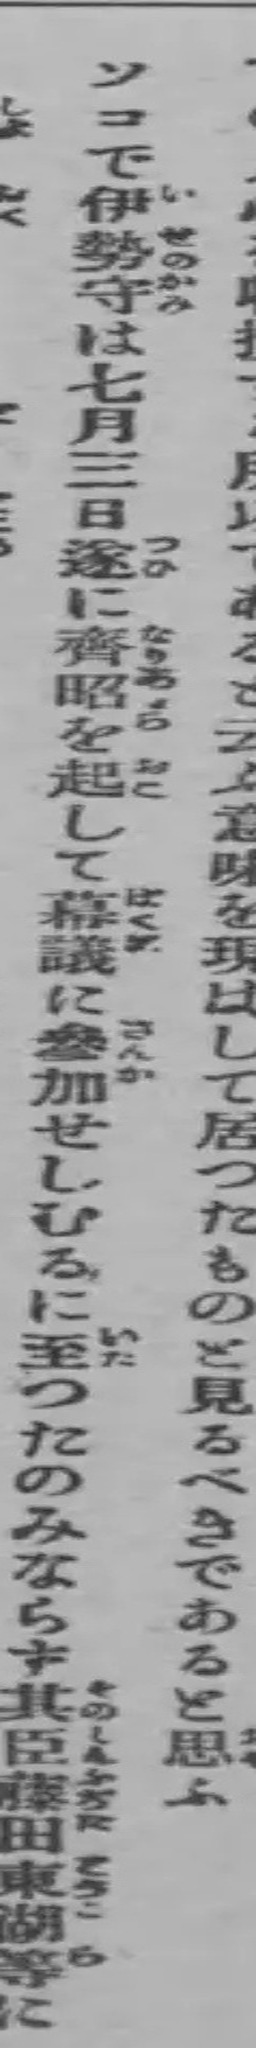ソコで伊勢守は七月三日遂に斉昭を起して幕議に参加せしむるに至つたのみならず其臣藤田東湖等に
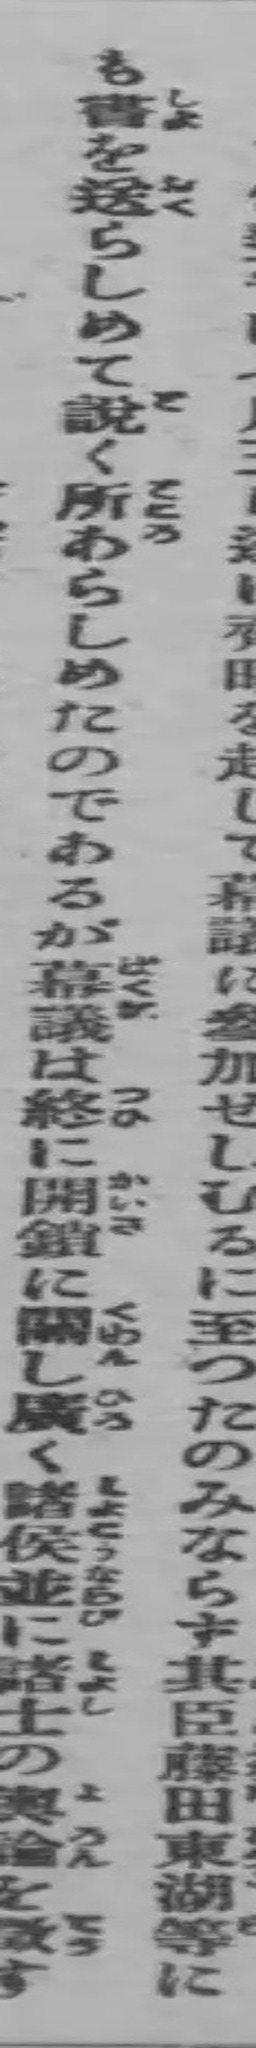も書を送らしめて説く所あらしめたのであるが幕議は終に開鎖に関し広く諸侯並に諸士の与論を徴す
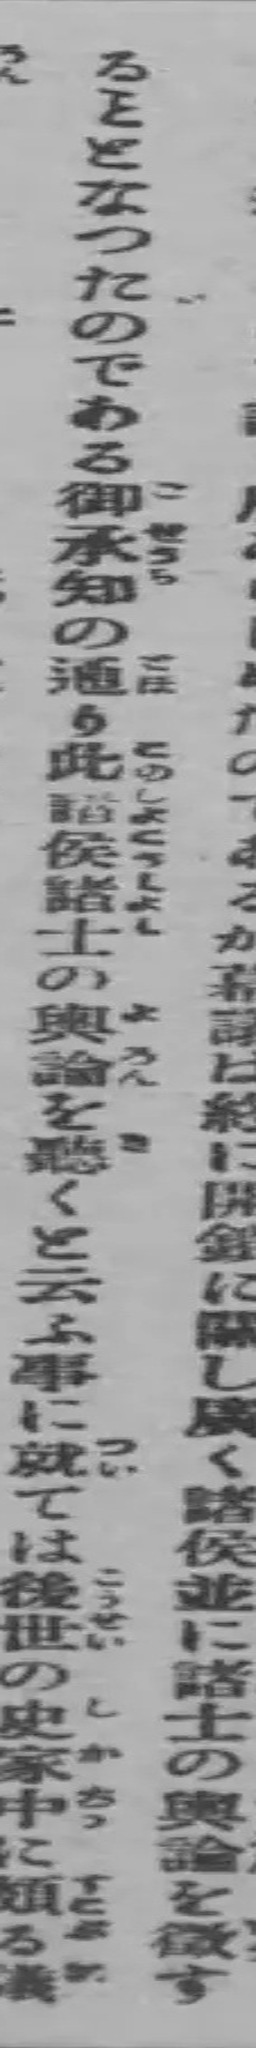ることとなつたのである御承知の通り此諸侯諸士の与論を聴くと云ふ事に就ては後世の史家中に頗る議
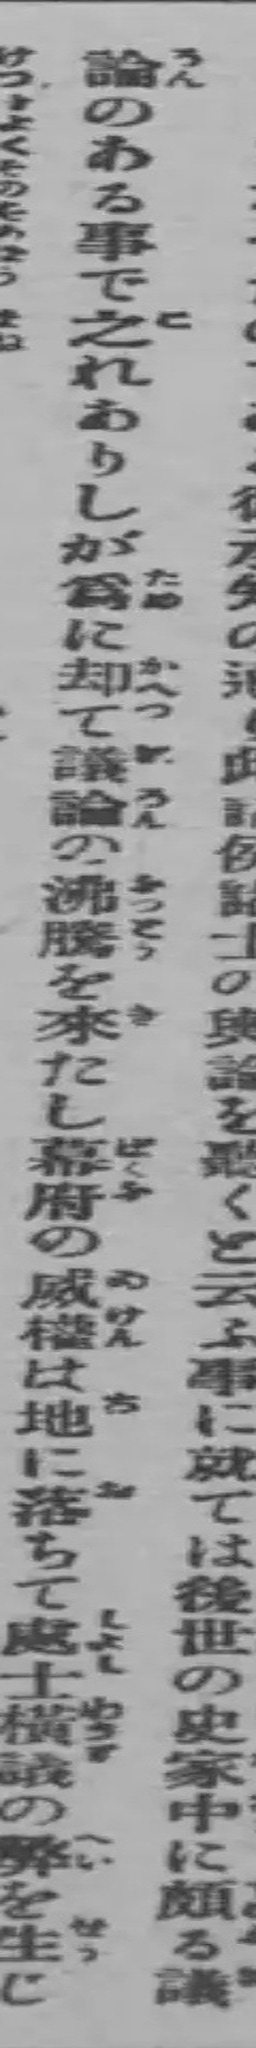論のある事で之れありしが為に却つて議論の沸騰を来たし幕府の威権は地に落ちて処士横議の弊を生じ
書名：豊橋市史談
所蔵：国立国会図書館 National Diet Library, JAPAN
